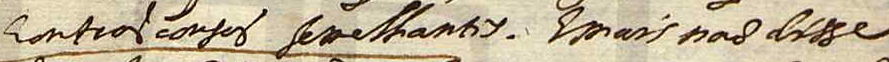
E outras cousas semelhantes. E mais naõ disse
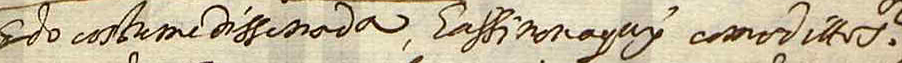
E do costume disse nada, E assinou aquy com o ditto s.or
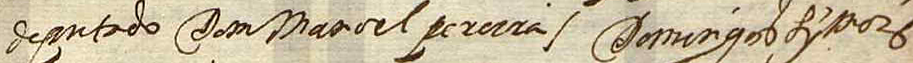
deputado Dom Manoel pereira / Domingos symoĩs
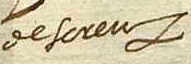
o escreuj
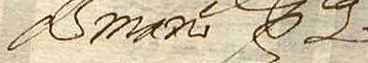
dō manoel pra
